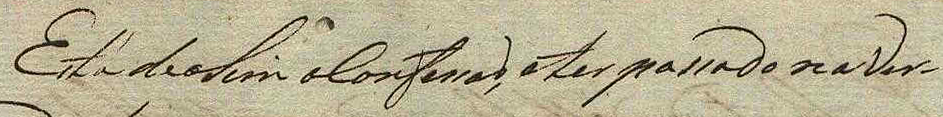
Está de aSim o Confessar, e ter passado na Ver
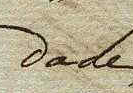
dade
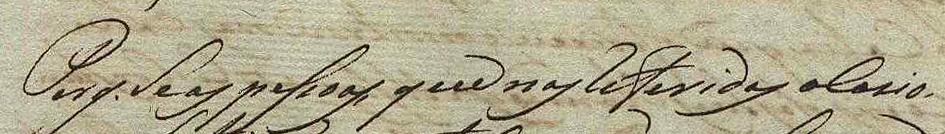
Perg. se as pessoas que nas Referidas oCazio
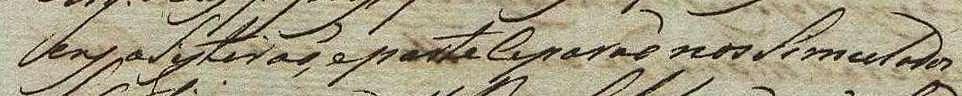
ens, asistiraõ, e parteCeparaõ nos Simulados
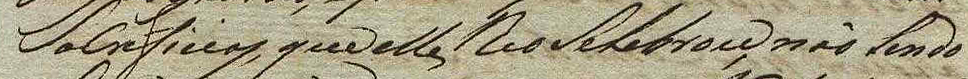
SaCreficios, que elle Reo Selebrou, naõ sendo
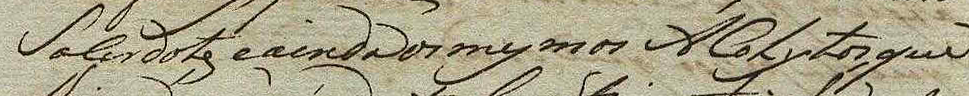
SaCerdote, e ainda os mesmos ACoLytos, que
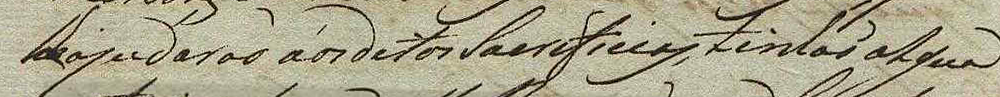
lhe ajudaraõ aos ditos Sacreficios, tinhaõ algua
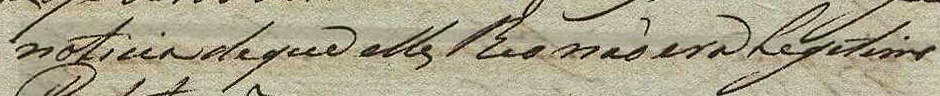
noticia de que elle Reo naõ era Legitimo
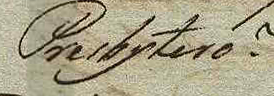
Presbytero?
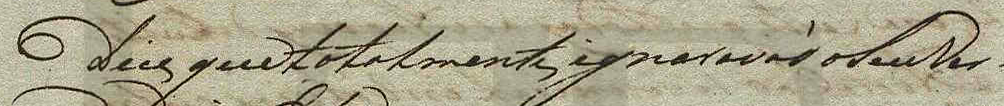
Dice que totalmente ignoravaõ o Seu Ver
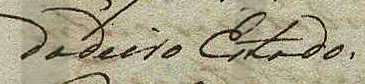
dadeiro Estado.
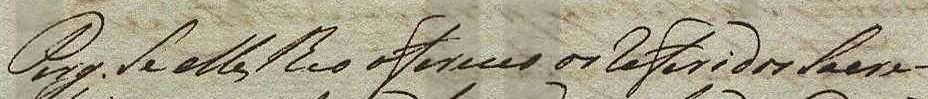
Perg. se elle Reo ofereceo os Referidos Sacre
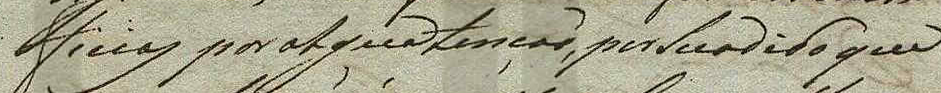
ficios por algua tençaõ, persuadido que
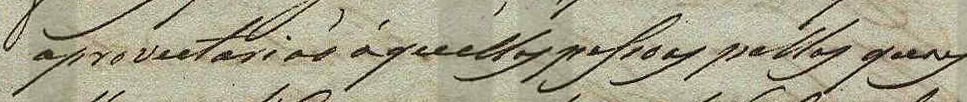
aprovetariaõ áquellas pessoas pellas quaes
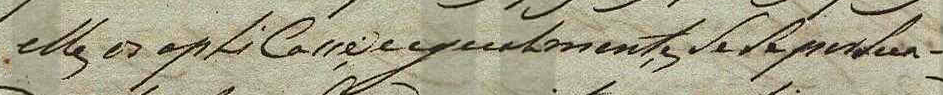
elle os apliCasse, e egualmente, se se persua
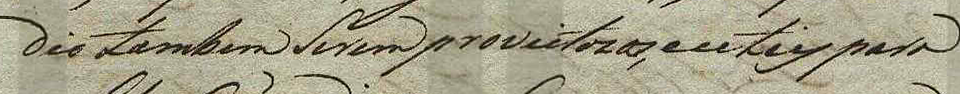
dio tambem serem proveitozos, e uteis para
